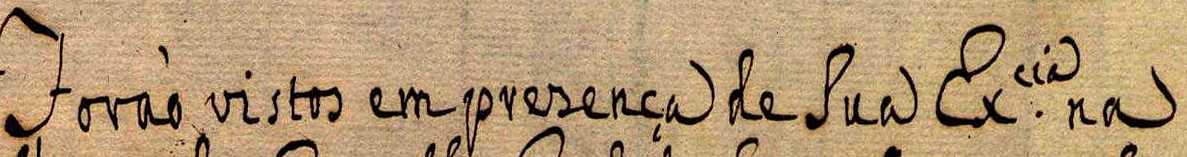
Foraõ vistos em prezença de Sua Ex.cia na
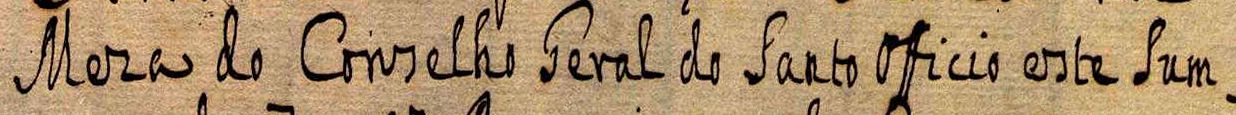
Meza do Conselho Geral do Santo Officio este sum
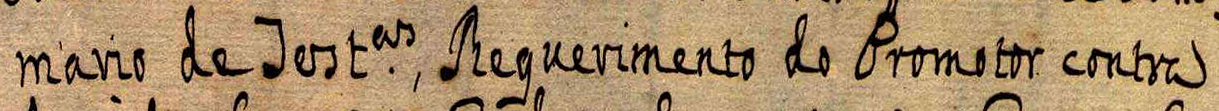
mario de Test.as, Requerimento do Promotor contra
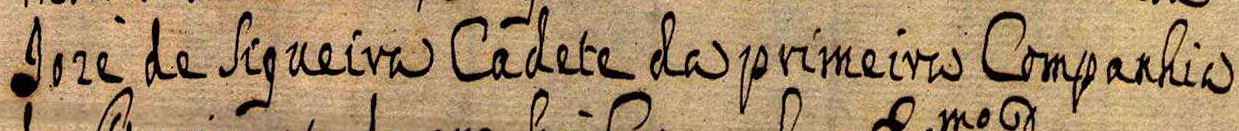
Iozé de Siqueira Cadete da primeira Companhia
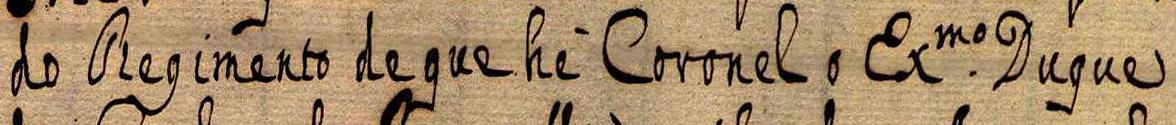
do Regimento de que hé Coronel o Ex.mo Duque
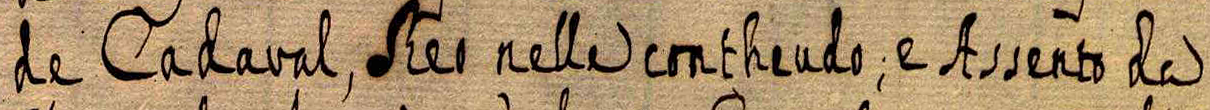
de Cadaval, Reo nelle contheudo; e Assento da
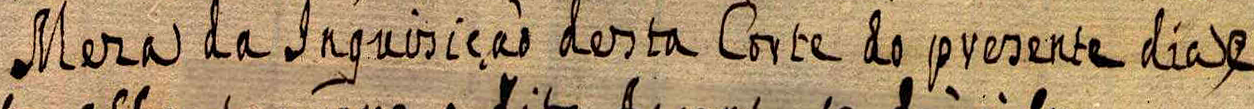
Meza da Inquisição desta Corte do presente dia e
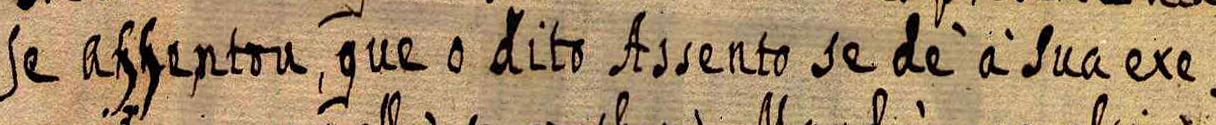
se assentou, que o dito Assento se dè á sua exe
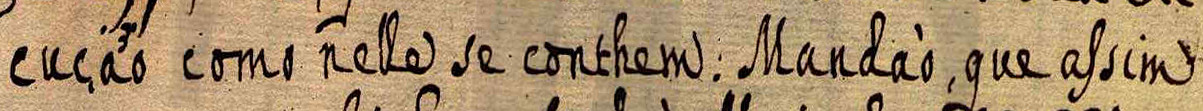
cuçaõ como nelle se conthem: Mandaõ, que assim
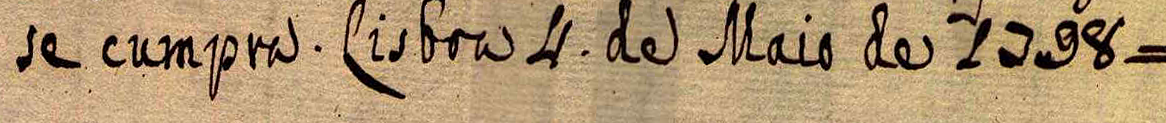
se cumpra. Lisboa 4. de Maio de 1798
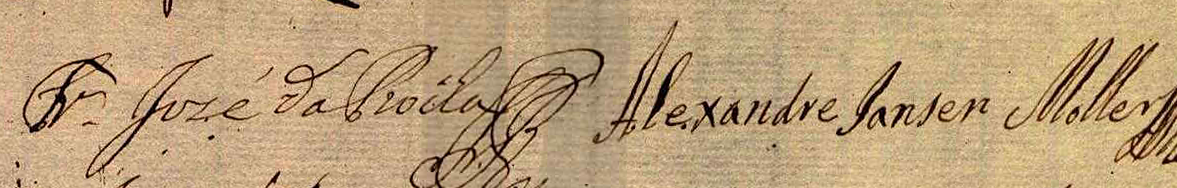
Fr. Jozé da Rocha Alexandre Iansen Moller
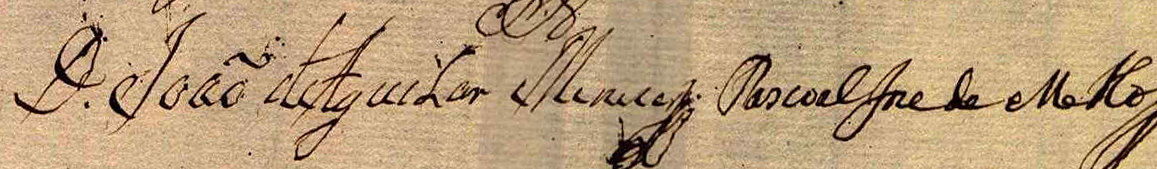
P. Joaõ de AguiLar Menezes Pascoal Joze de Mello
